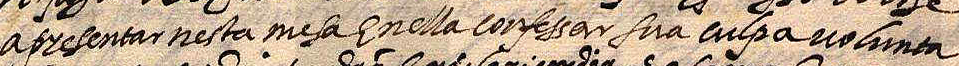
apresentar nesta mesa E nella confessar sua culpa uolunta
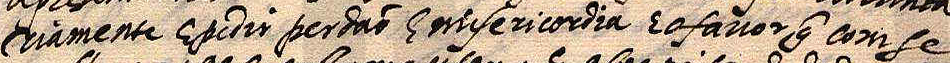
riamente E pedir perdaõ E misericordia E o fauor q̄ com se
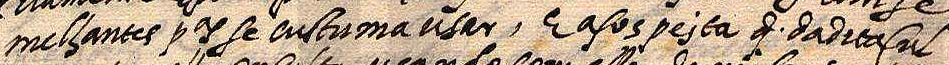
melhantes pas se custuma usar, E a sospeita q̄ da dita Cul
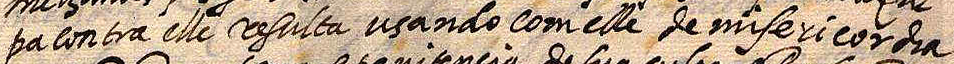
pa contra elle resulta usando com elle de misericordia
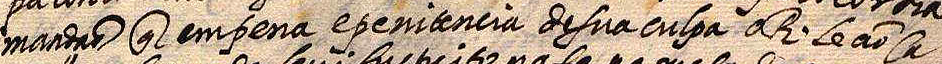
mandaõ q̄ em pena e penitencia de sua culpa o R. Leaõ Ca
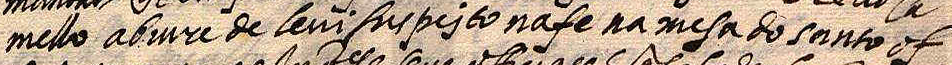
mello abiure de leui suspeito na fe na mesa do santo of
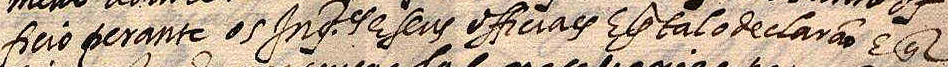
ficio perante os Jnq.res e seus officiaes E q̄ tal o declarão E q̄
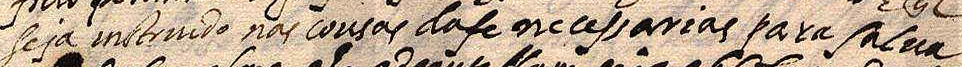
seja instruido nas cousas da fe necessarias para salua
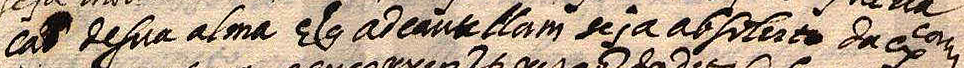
çaõ de sua alma, E q̄ ad cautellam seja absoluto da excam
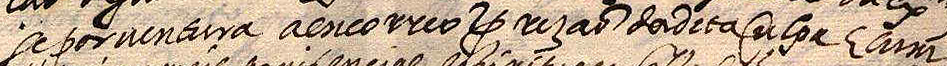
se por uentura a encorreo, p̄ rezaõ da dita Culpa e cum
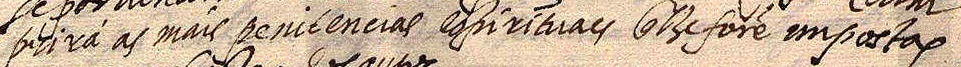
prirá as mais penitencias espirituaes q̄ lhe forē impostas
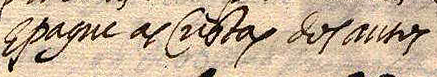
E pague as Custas dos autos
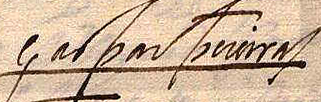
Gaspar pereira
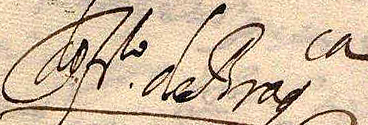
Dō fr.co de Brag.ça
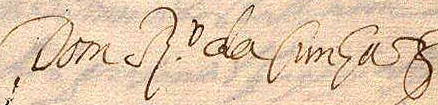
Dom R.o da Cunha
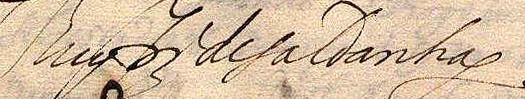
Ruy frz de saldanha
